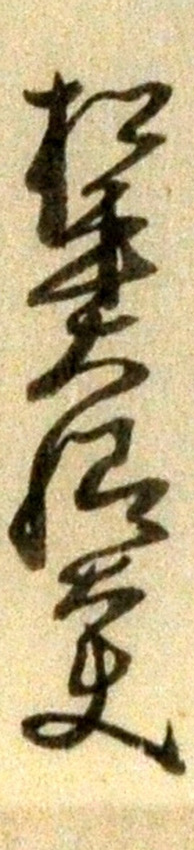松平大膳大夫
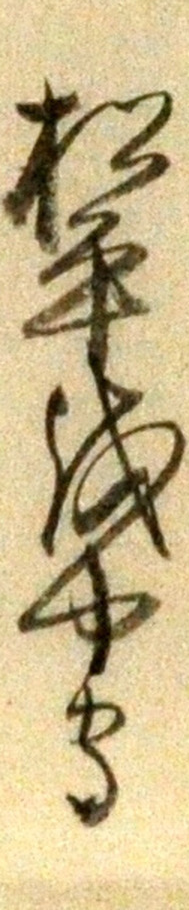松平越中守
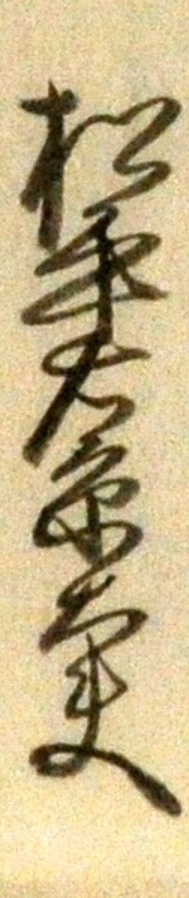松平右京大夫
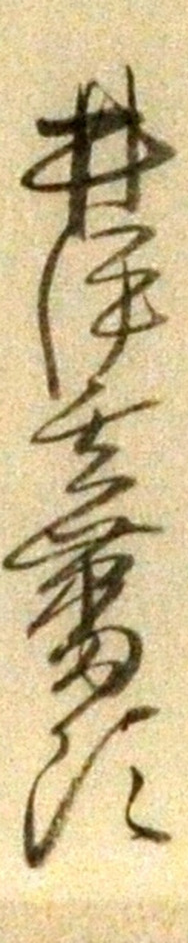井伊玄蕃頭
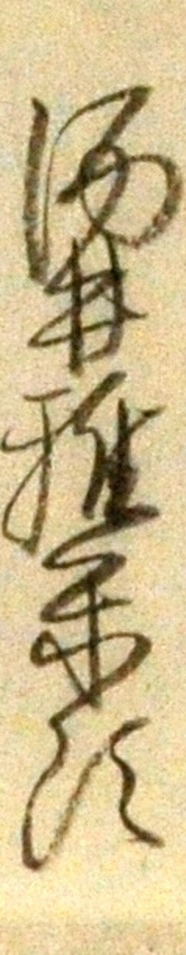酒井雅楽頭
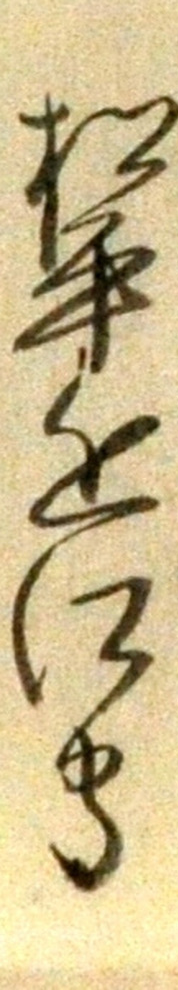松平近江守
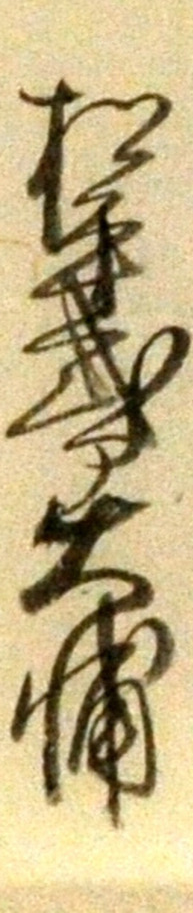松平式部大輔

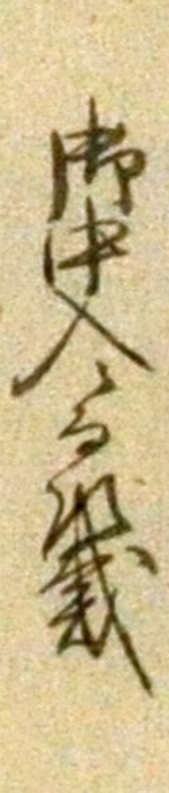御中入ニ而頂戴
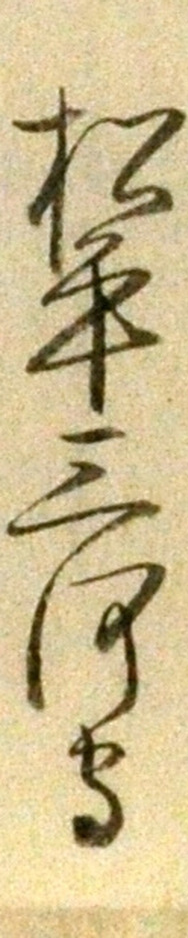松平三河守
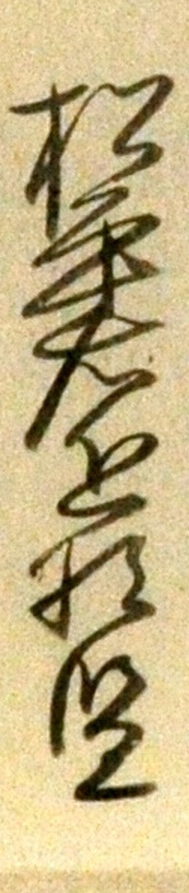松平右近将監
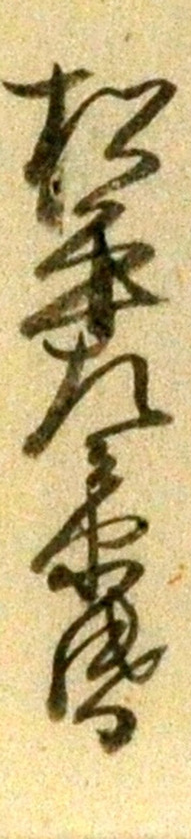煩松平左兵衛督
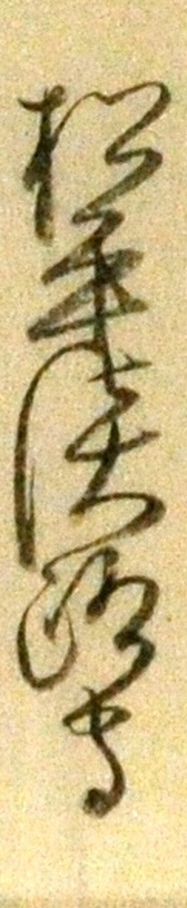松平淡路守
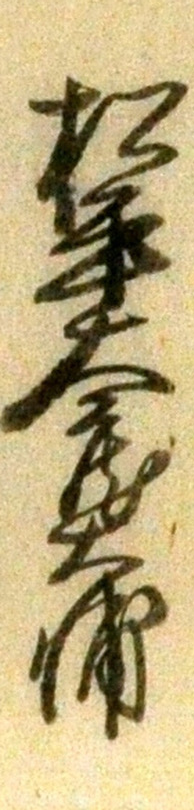松平大蔵大輔
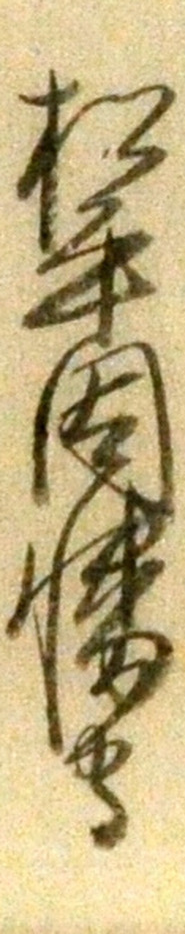煩松平因幡守
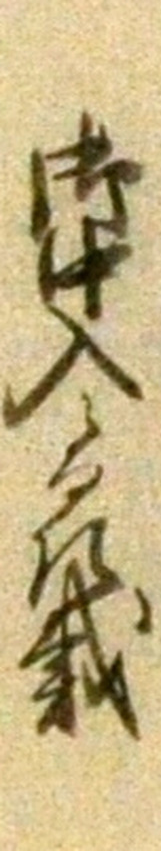御中入ニ而頂戴
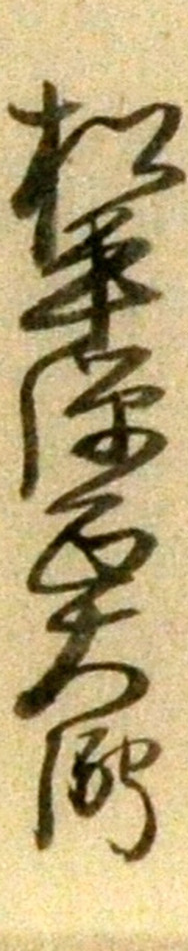松平弾正大弼
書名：御馳走御能ノ節ノ留外
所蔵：伊那市立高遠町図書館・合同会社AMANE
